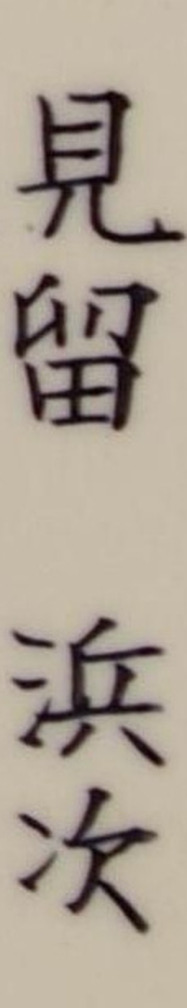見留浜次
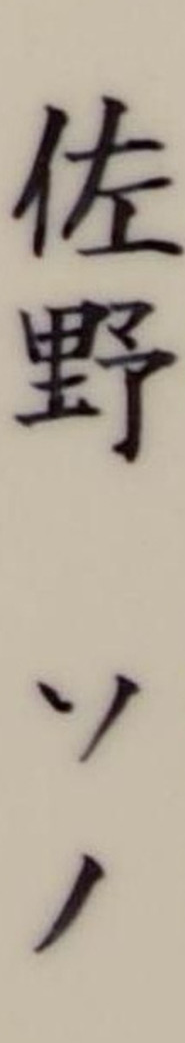佐野ソノ
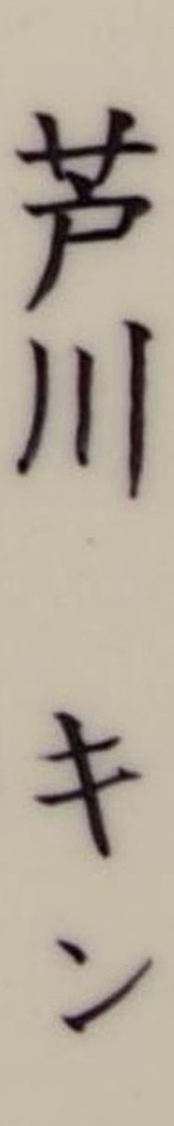芦川キン
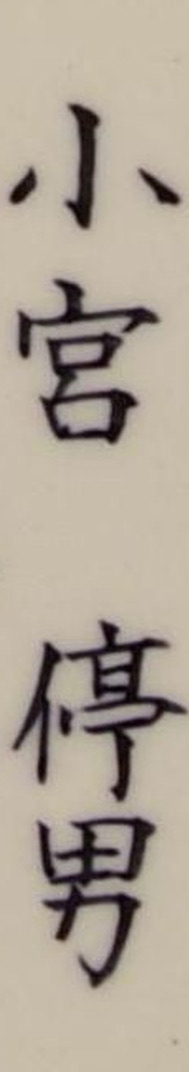小宮停男
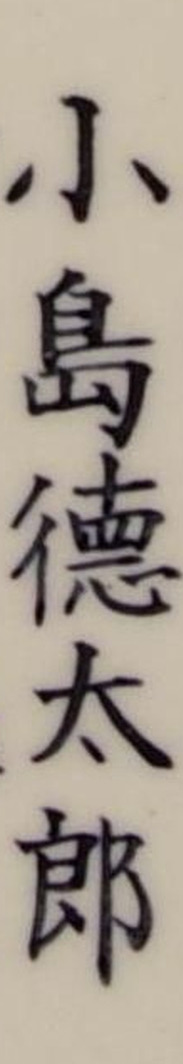小島徳太郎
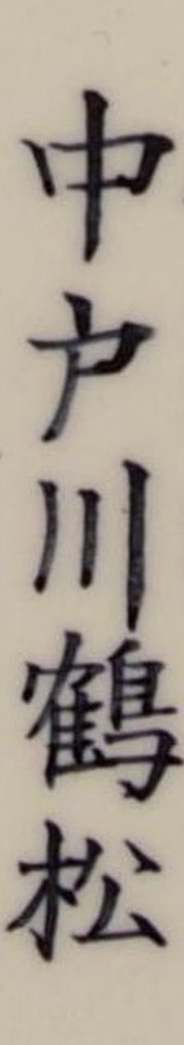中戸川鶴松
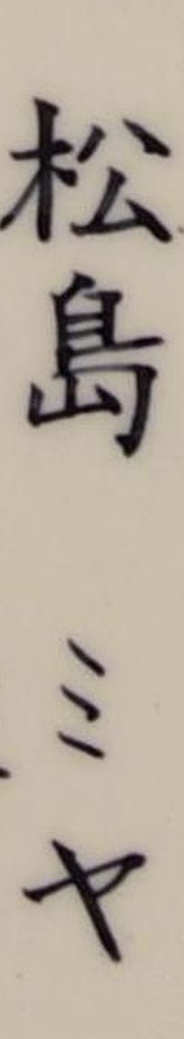松島ミヤ
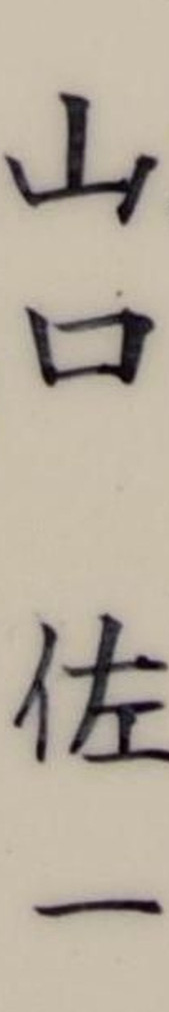山口佐一
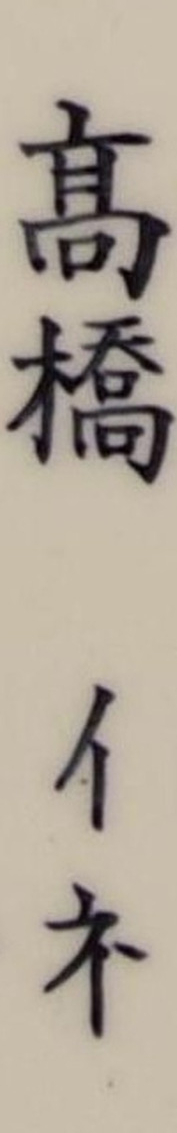高橋イネ
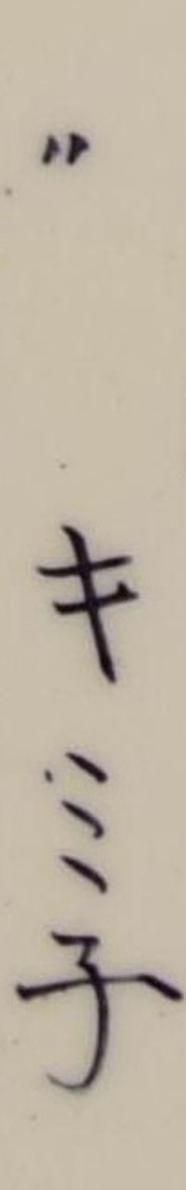キミ子
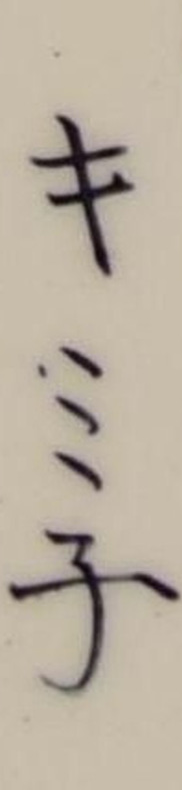キミ子
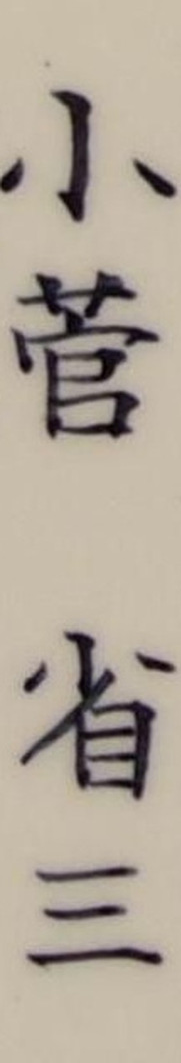小菅省三
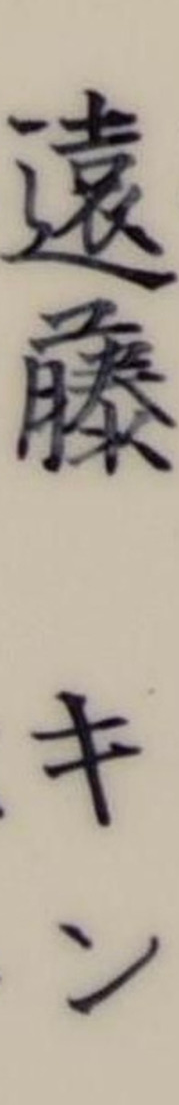遠藤キン
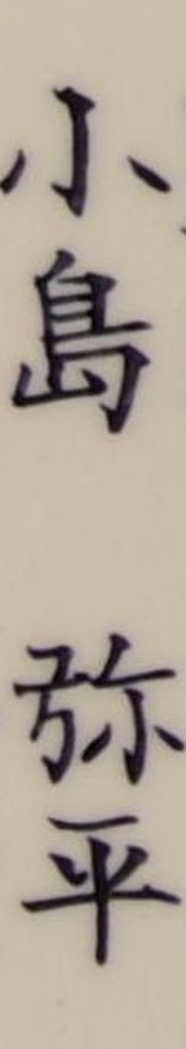小島弥平
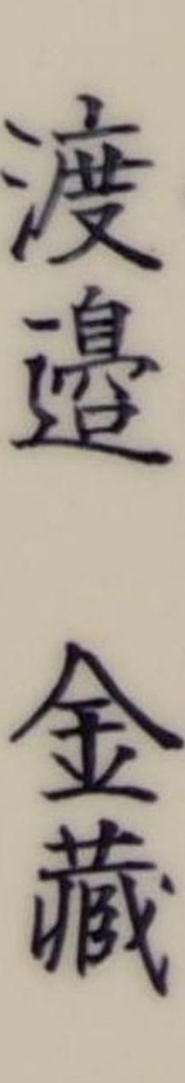渡邉金蔵
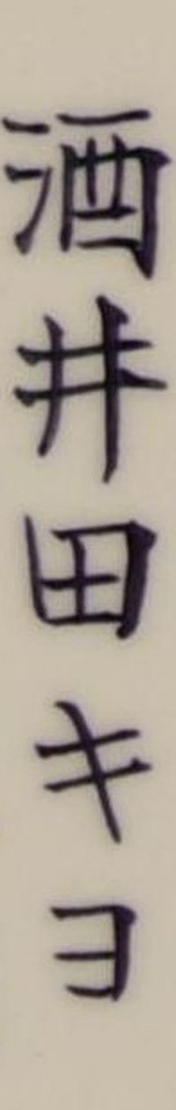酒井田キヨ
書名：M~S
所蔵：高野山金剛峯寺
